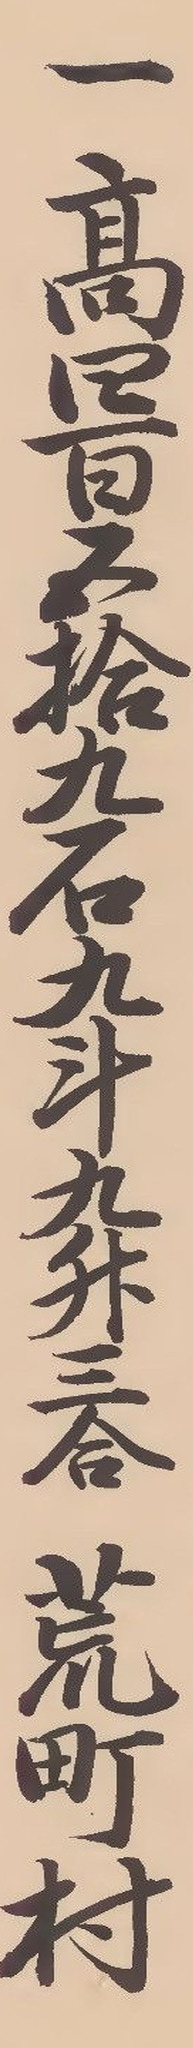一高四百五拾九石九斗九升三合荒町村
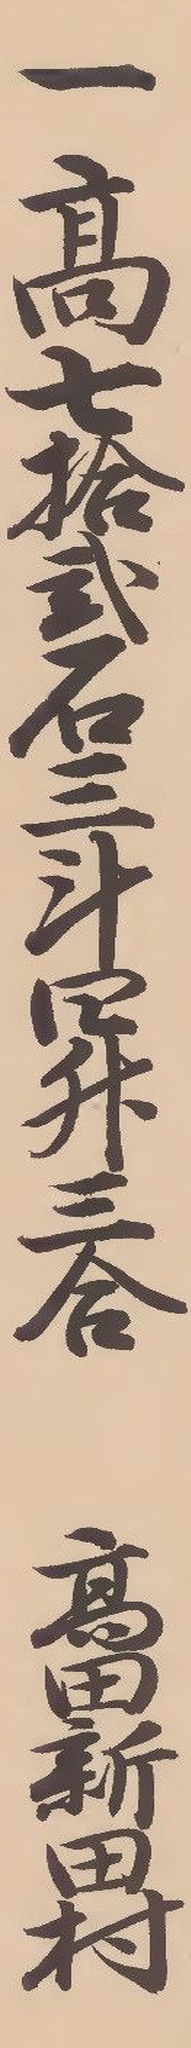一高七拾弐石三斗四升三合高田新田村
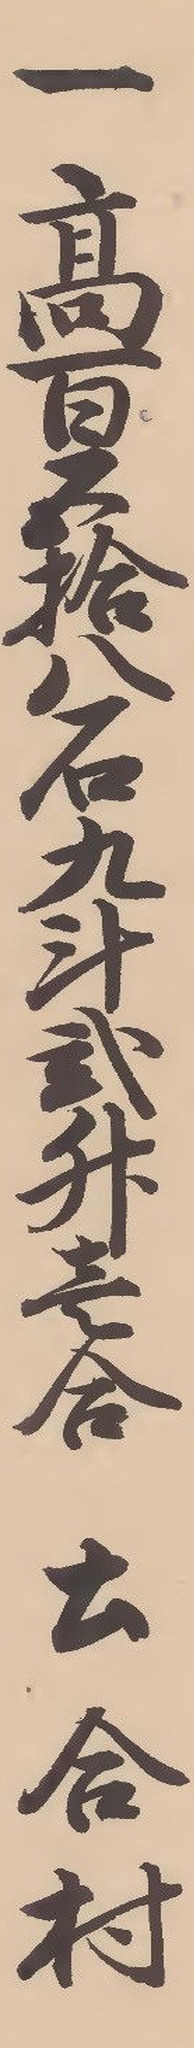一高百五拾八石九斗弐升壱合土合村
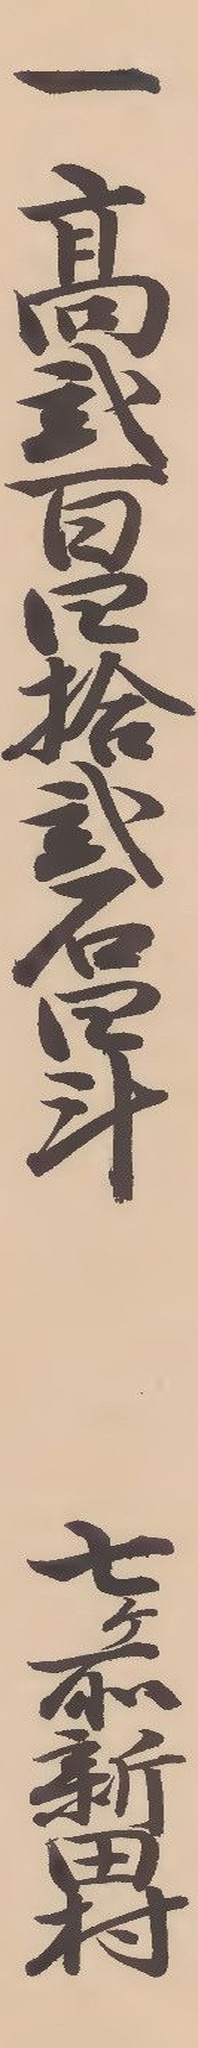一高弐百四拾弐石四斗七ヶ所新田村
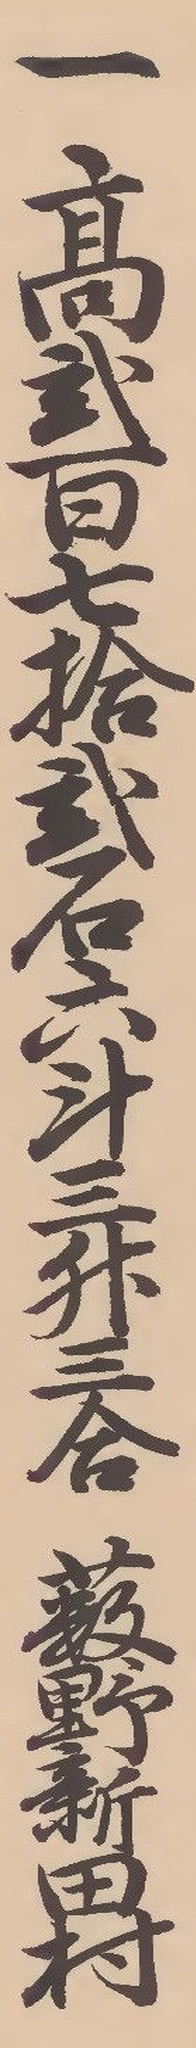一高弐百七拾弐石六斗三升三合薮野新田村

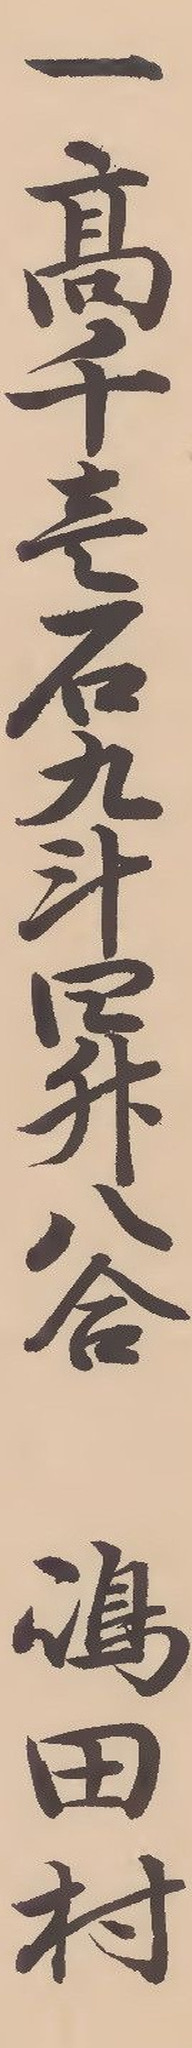一高千壱石九斗四升八合島田村
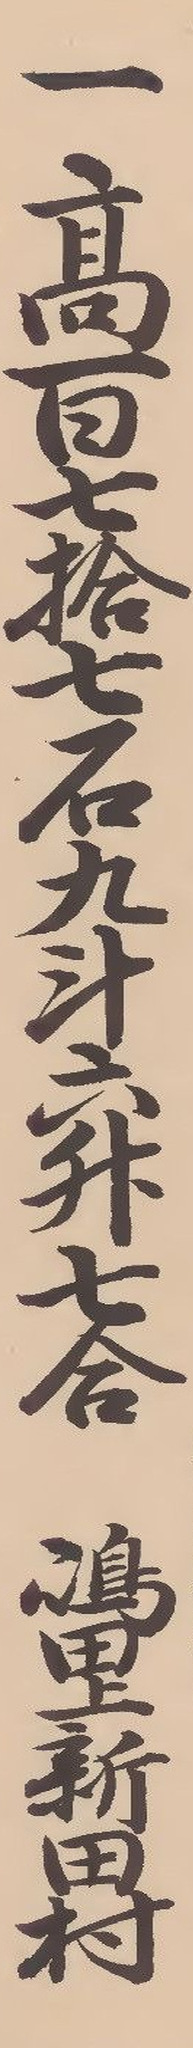一高百七拾七石九斗六升七合島田上新田村
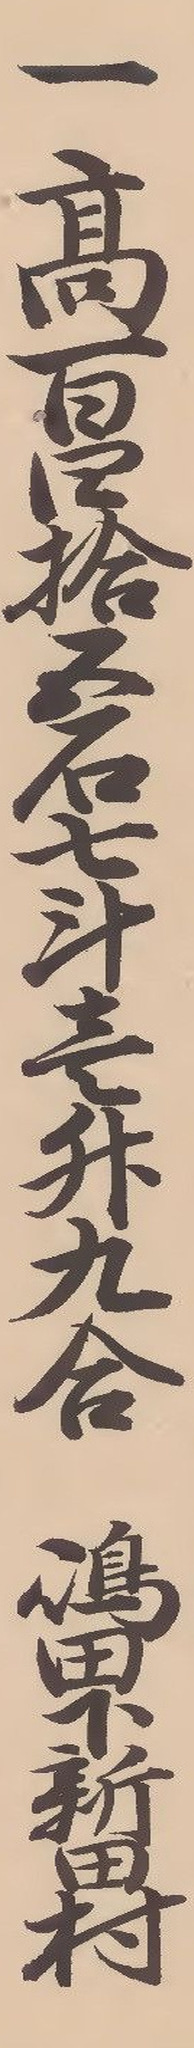一高百四拾五石七斗壱升九合島田下新田村
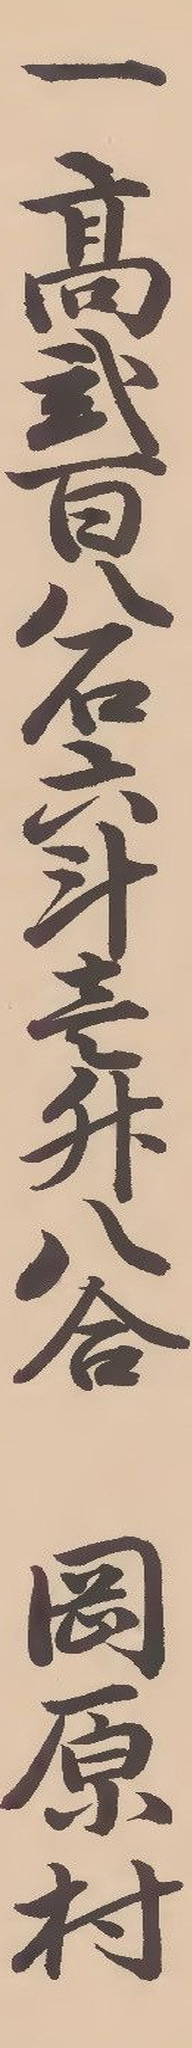一高弐百八石六斗壱升八合岡原村
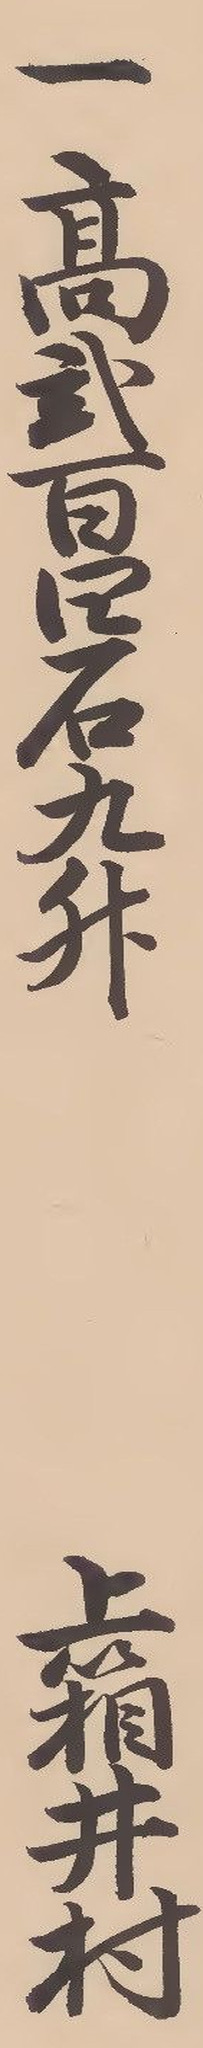一高弐百四石九升上箱井村
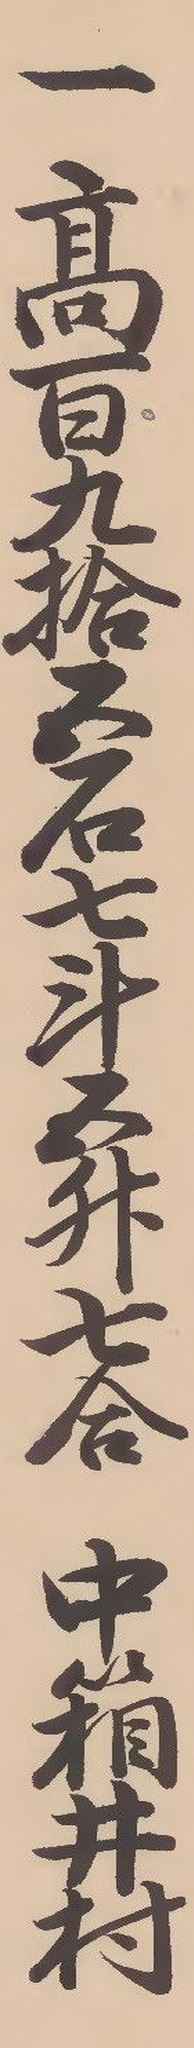一高百九拾五石七斗五升七合中箱井村
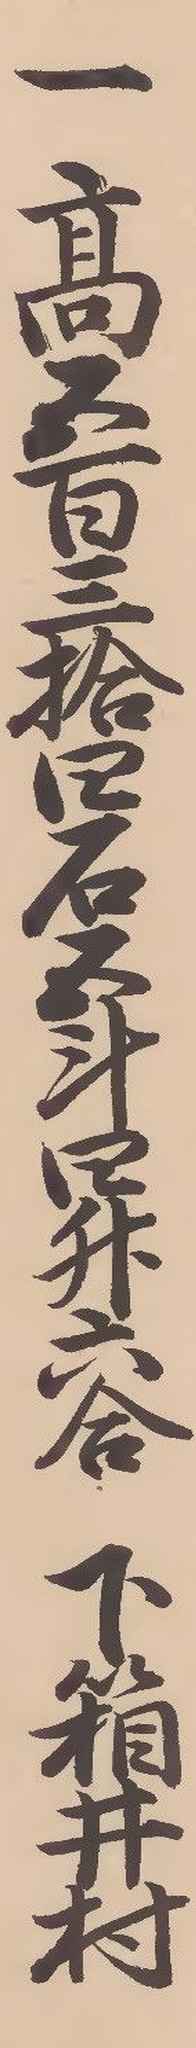一高五百三拾四石五斗四升六合下箱井村
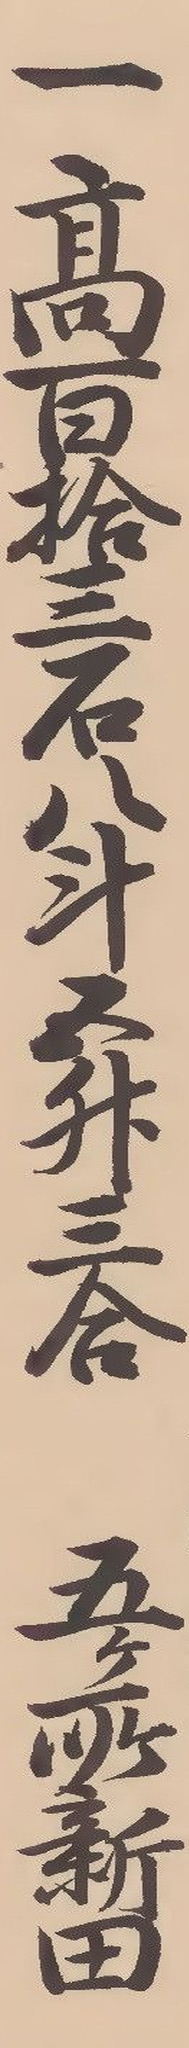一高百拾三石八斗五升三合五ヶ所新田

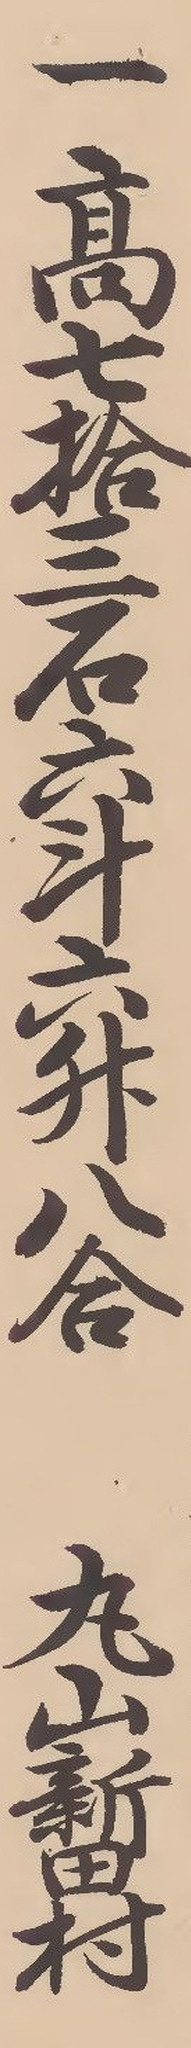一高七拾三石六斗六升八合丸山新田村
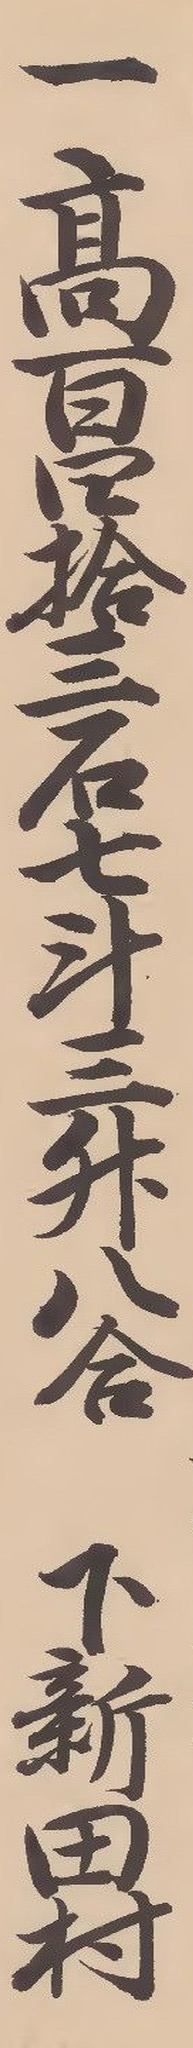一高百四拾三石七斗三升八合下新田村
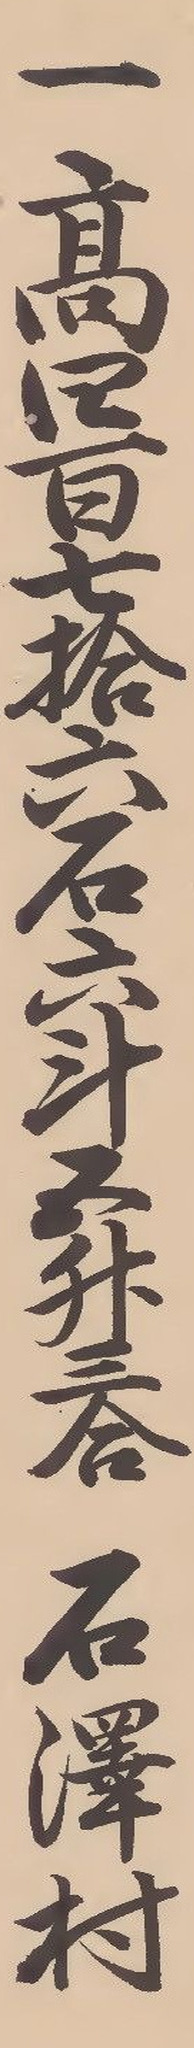一高四百七拾六石六斗五升三合石沢村
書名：越後国郷帳　上
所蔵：国立公文書館 National Archives of Japan
